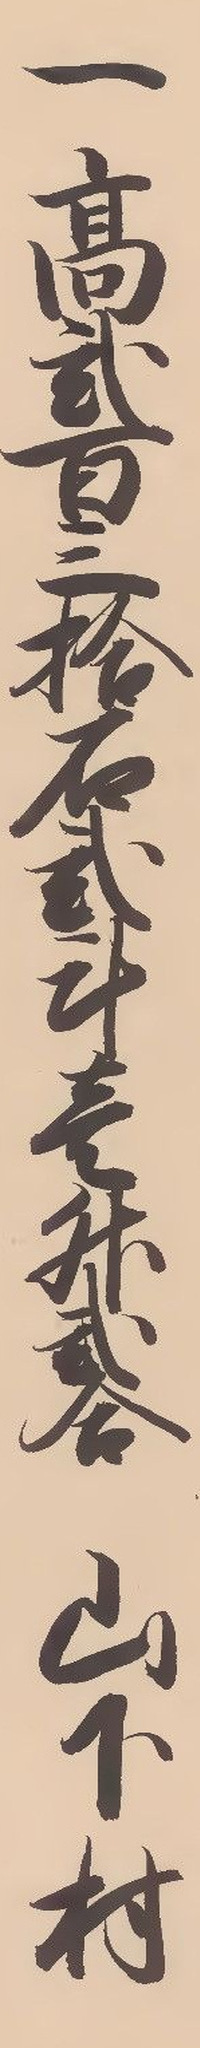一高弐百三拾石弐斗壱升弐合山下村
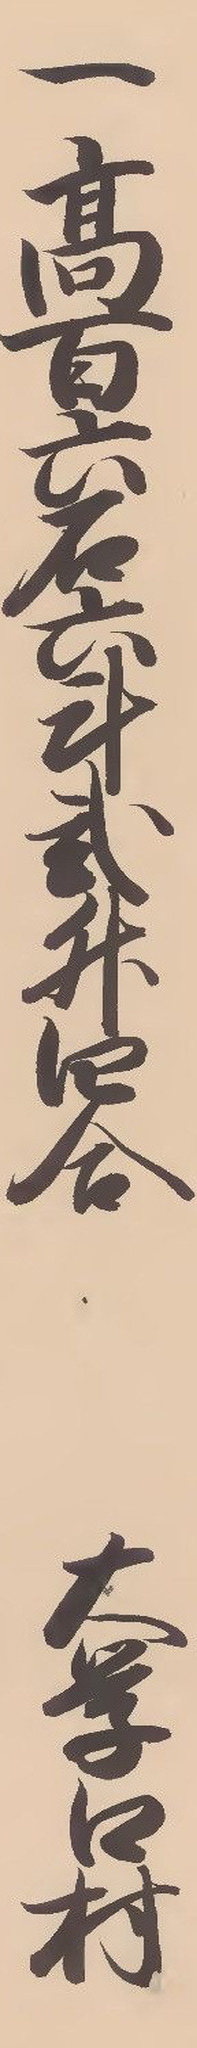一高百六石六斗弐升四合大学口村
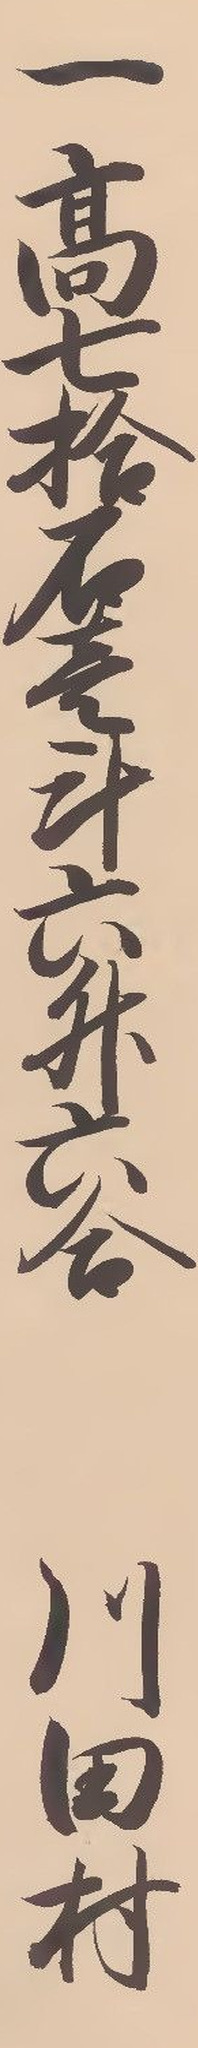一高七拾石壱斗六升六合川田村
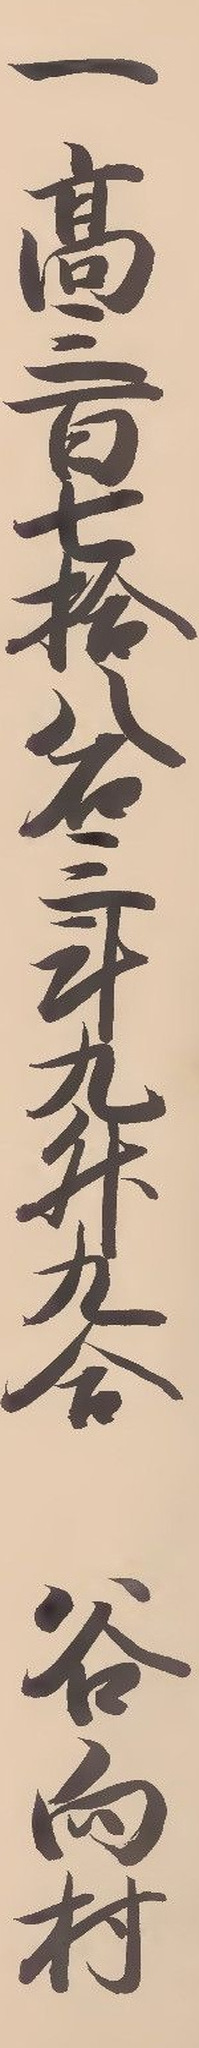一高三百七拾八石三斗九升九合谷向村
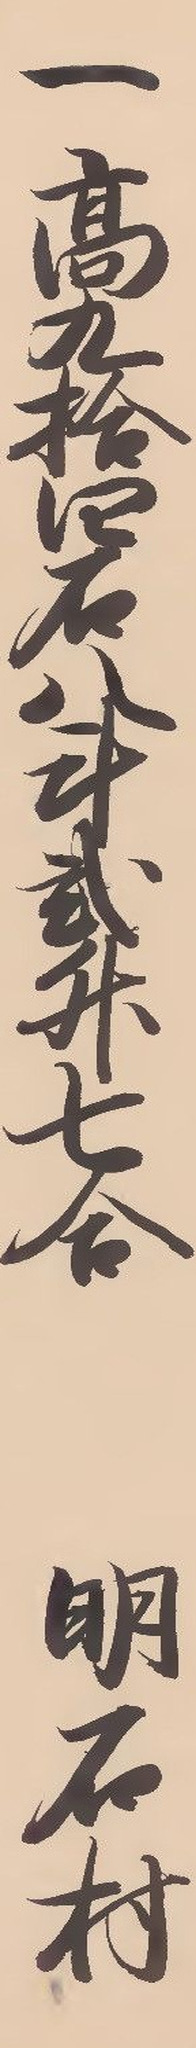一高九拾四石八斗弐升七合明石村
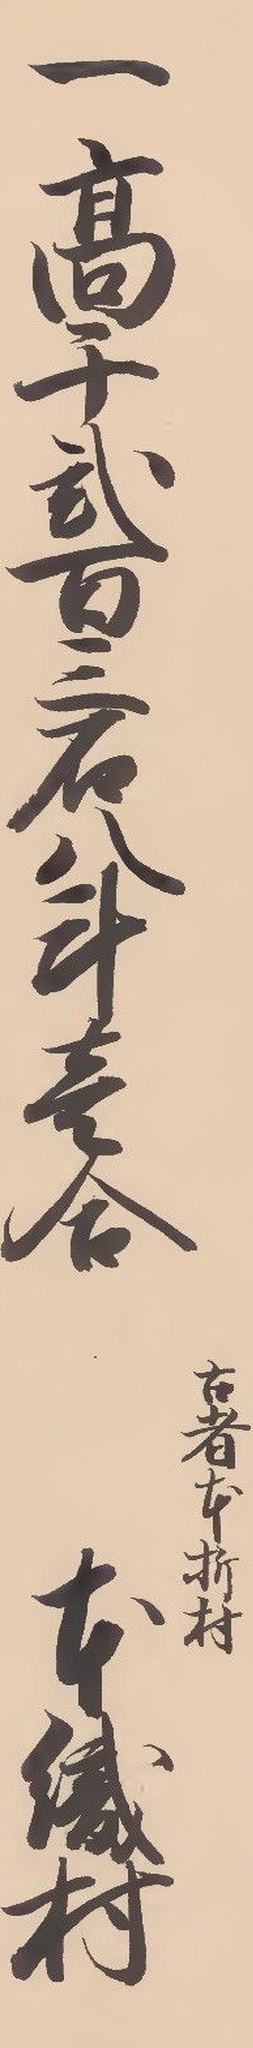一高千弐百三石八斗壱合本織村
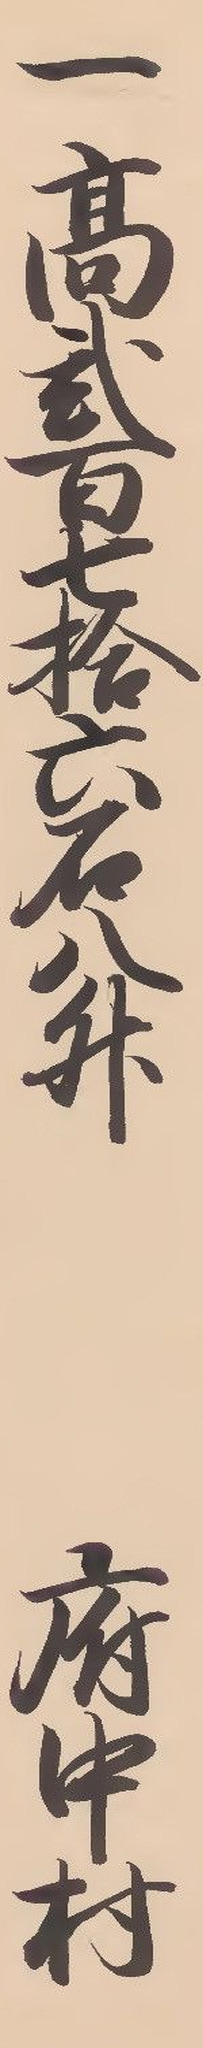一高弐百七拾六石八升府中村

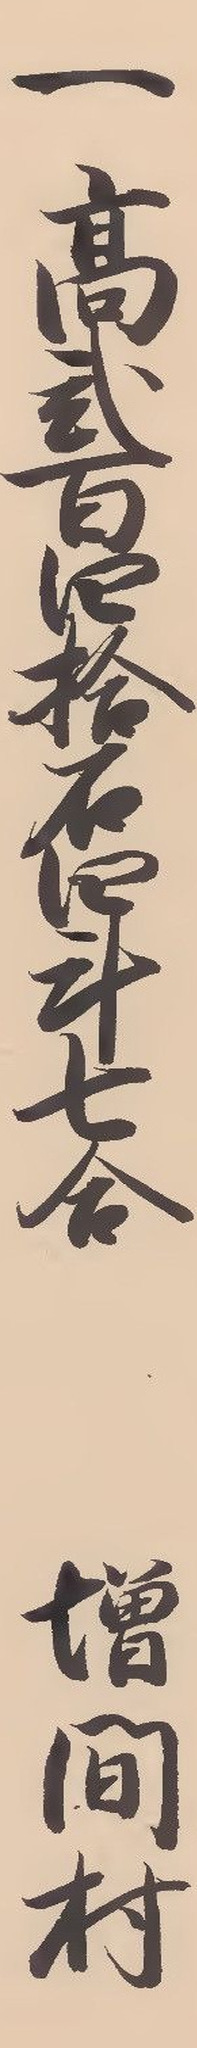一高弐百四拾石四斗七合増間村
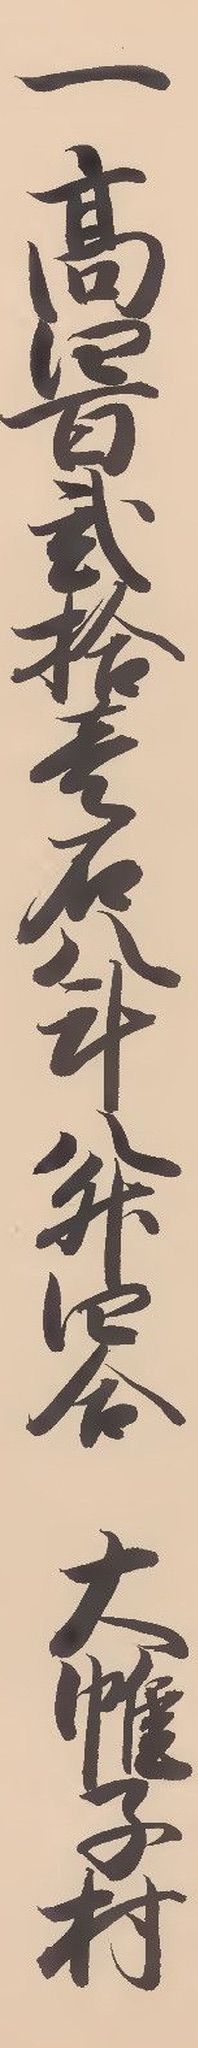一高四百弐拾壱石八斗八升四合大帷子村
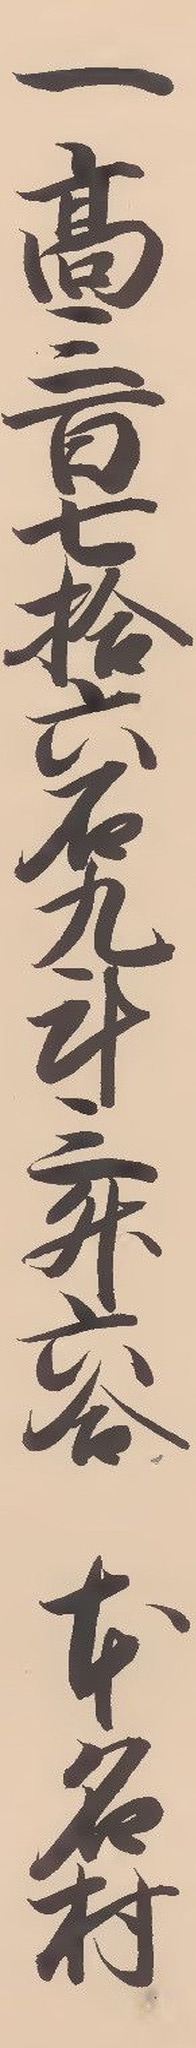一高三百七拾六石九斗三升六合本名村
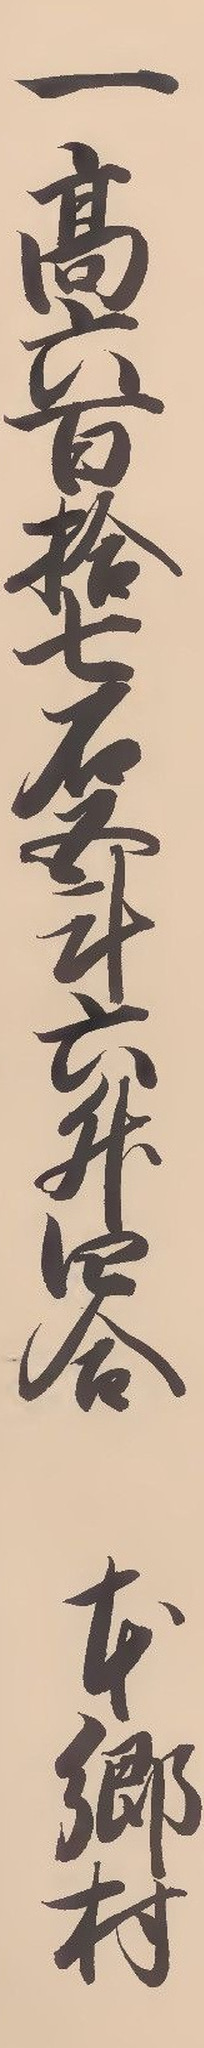一高六百拾七石五斗六升四合本郷村
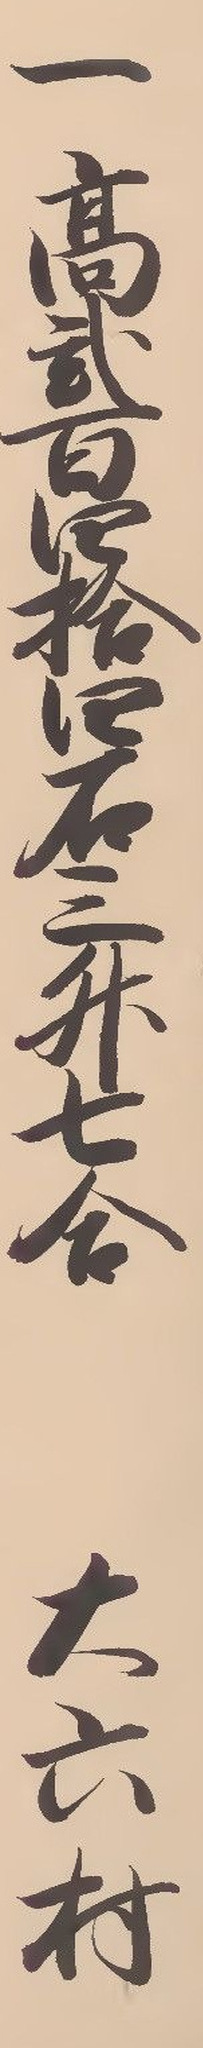一高弐百四拾四石三升七合大六村
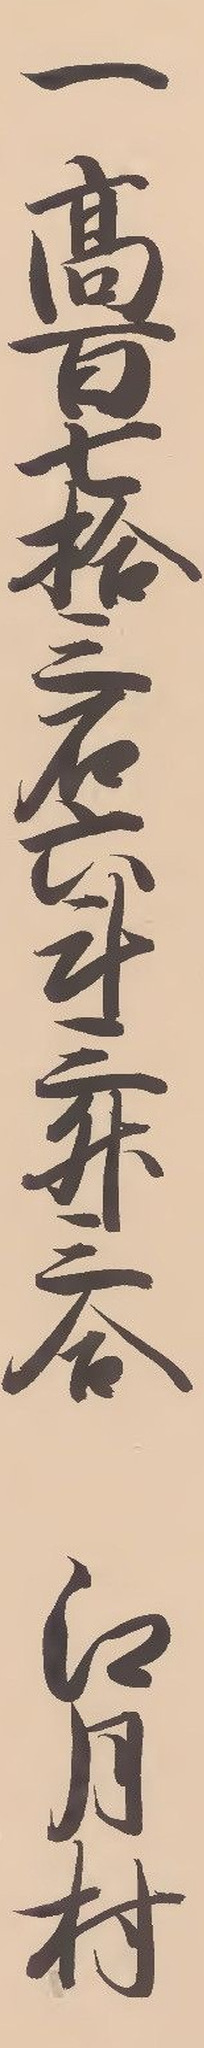一高百七拾三石六斗三升三合江月村
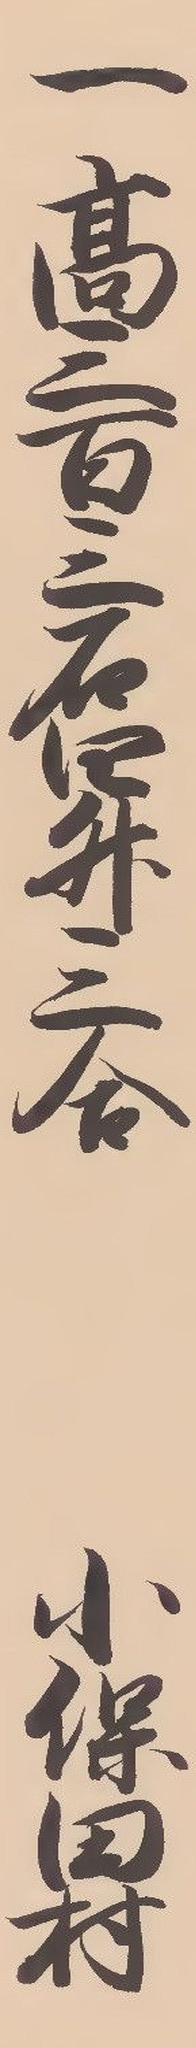一高三百三石四升三合小保田村
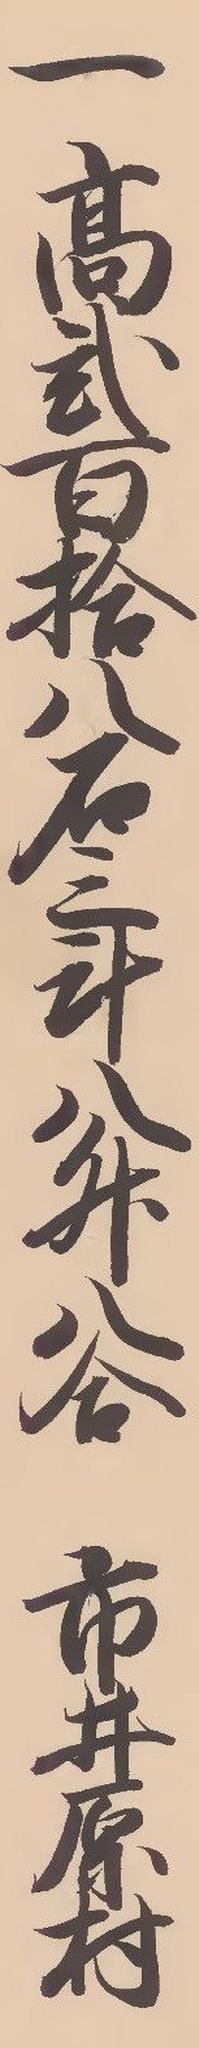一高弐百拾八石三斗八升八合市井原村

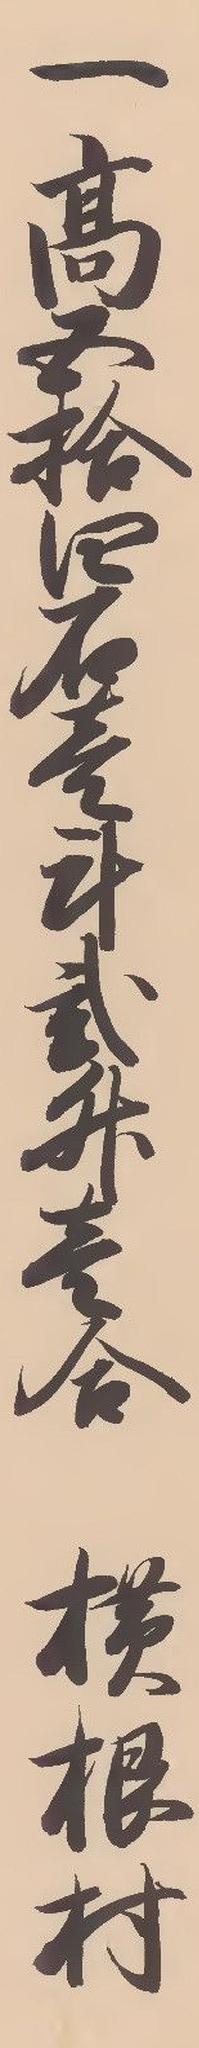一高五拾四石壱斗弐升壱合横根村
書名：安房国郷帳
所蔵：国立公文書館 National Archives of Japan
